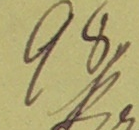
98
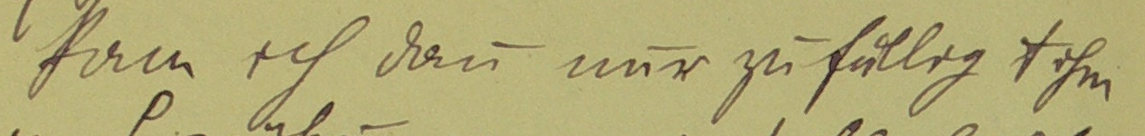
kam ich dann nur zufällig mit ihm
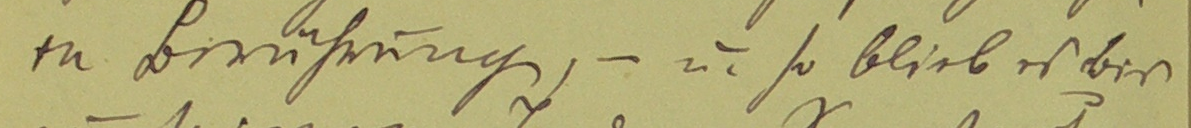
in Berührung,-und so blieb es bis
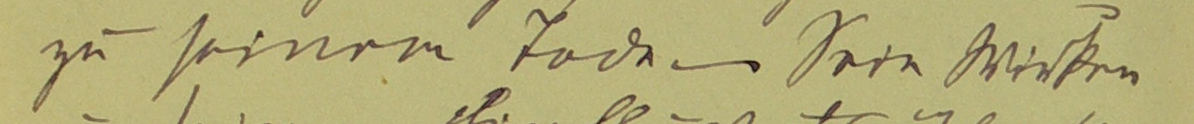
zu seinem Tode.-Sein Wirken
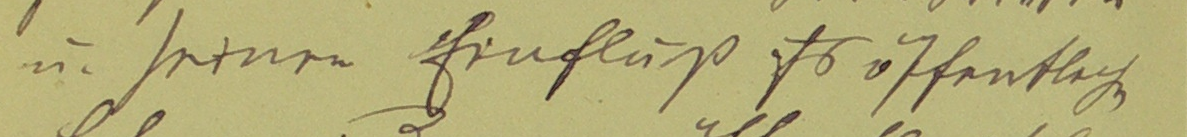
und seinen Einfluss aufs öffentliche
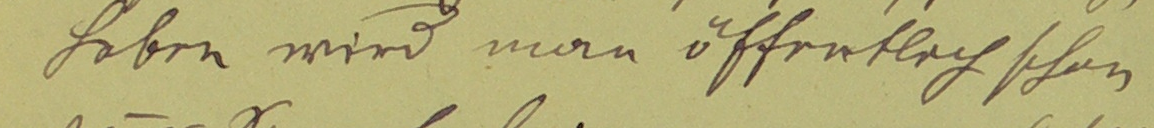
Leben wird man öffentlich schon
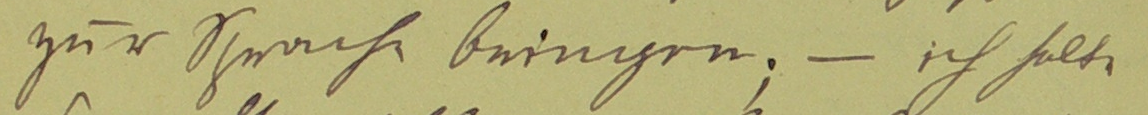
zur Sprache bringen.-Ich halte
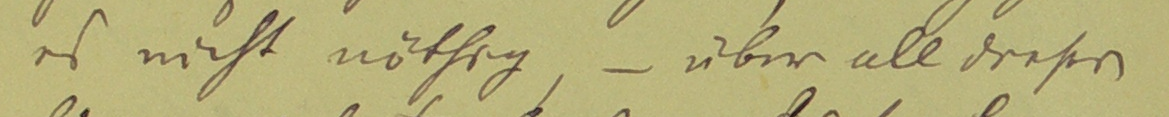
es nicht nöthig,- über all dieses
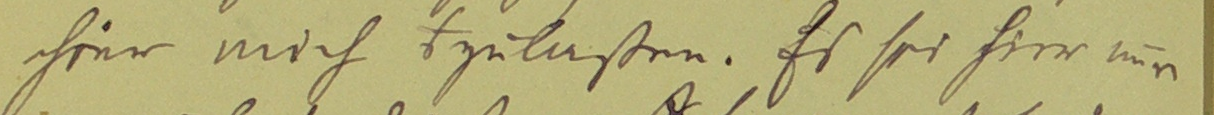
hier mich auszulassen Es sei hier nur
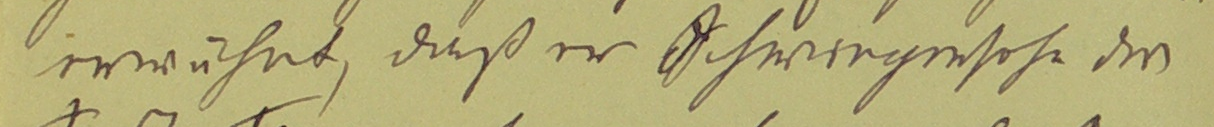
erwähnt, daß er Schwiegersohn des
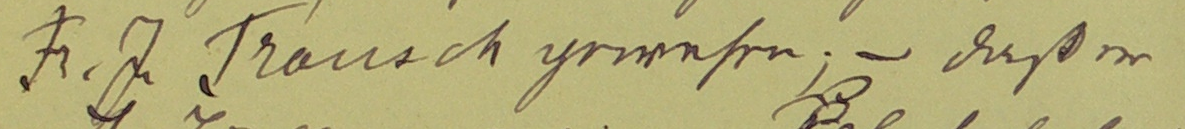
Fr. J. Trausch gewesen;- daß er
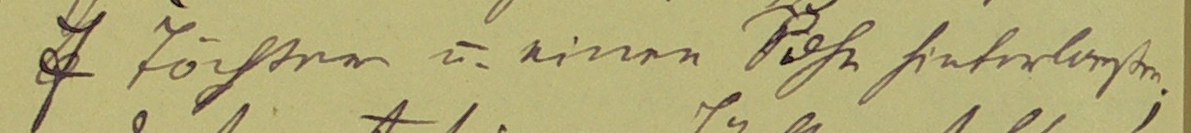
7 Töchter und einen Sohn hinterlassen;
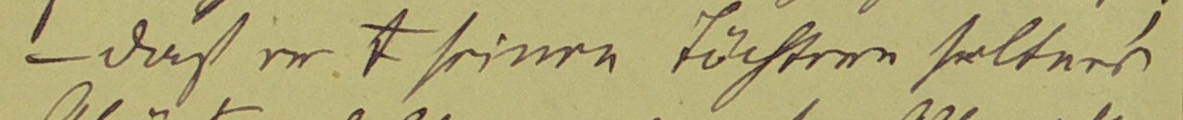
- Daß er mit seinen Töchtern seltenes
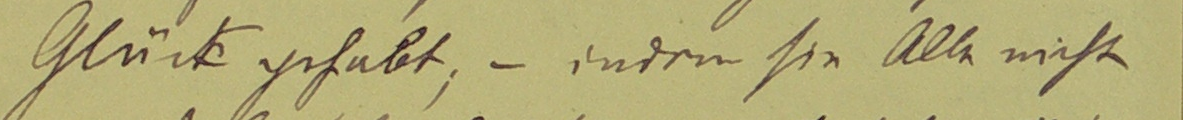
Glück gehabt;- indem sie alle nicht
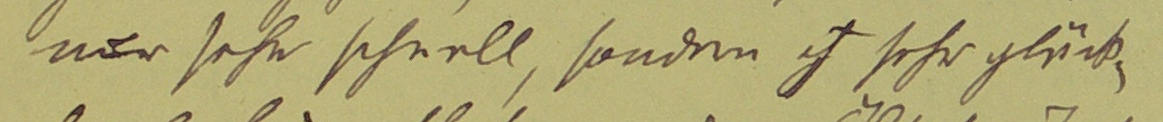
nur sehr schnell, sondern auch sehr glück¬
